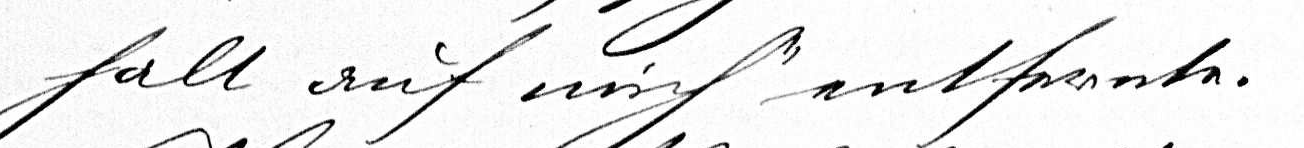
halt auf mich“ entfernte.
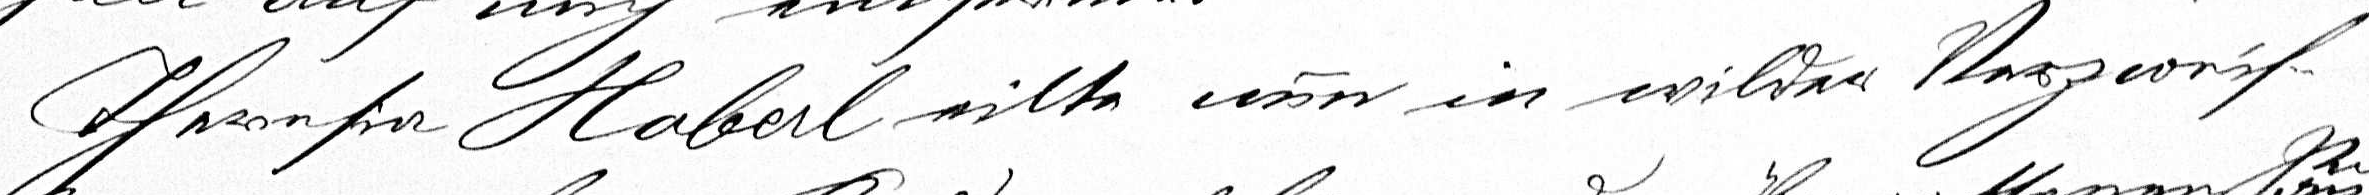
Theresia Haberl eilte nun in wilder Verzweif¬
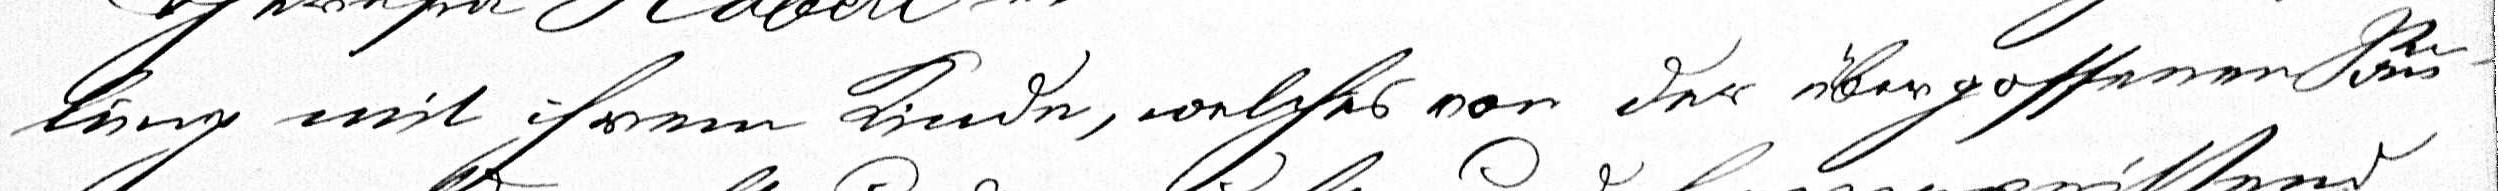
lung mit ihrem Kinde, welches von der übergossenen Säu¬
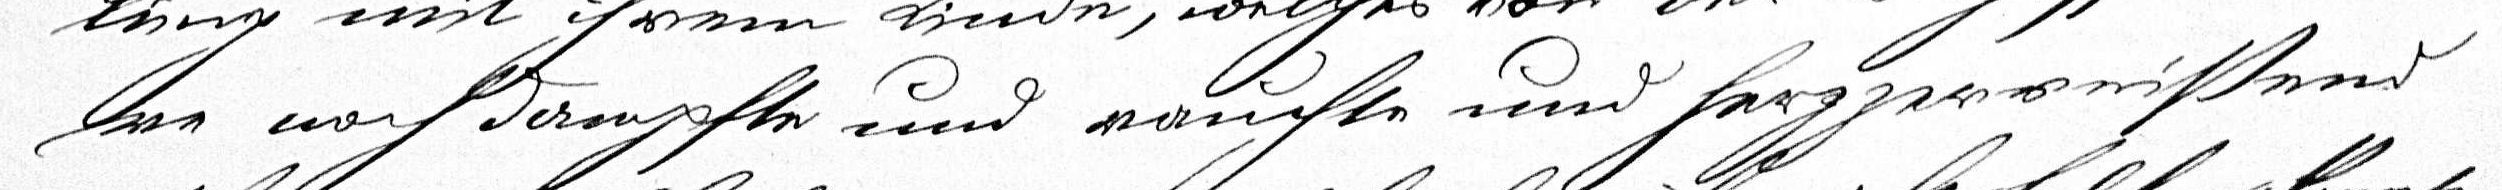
re noch dampfte und rauchte und herzzerreißend
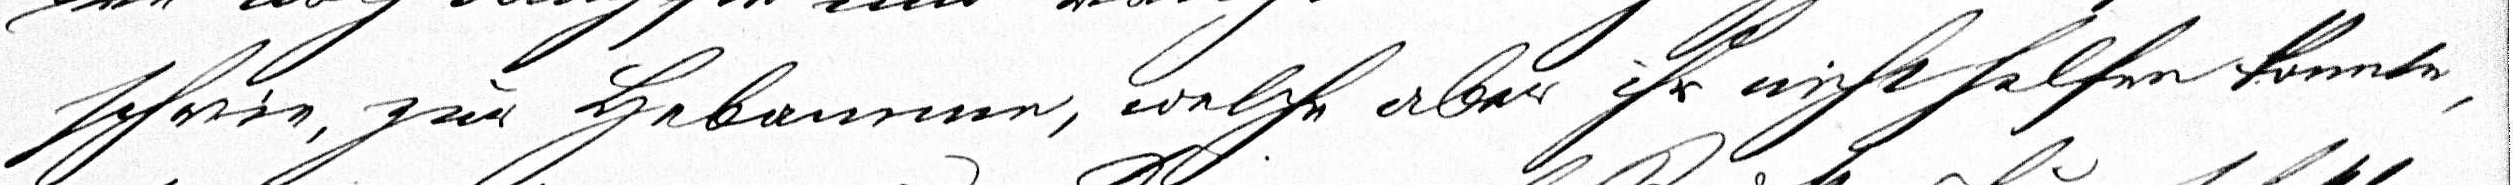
schrie, zur Hebamme, welche aber ihr nicht helfen konnte,
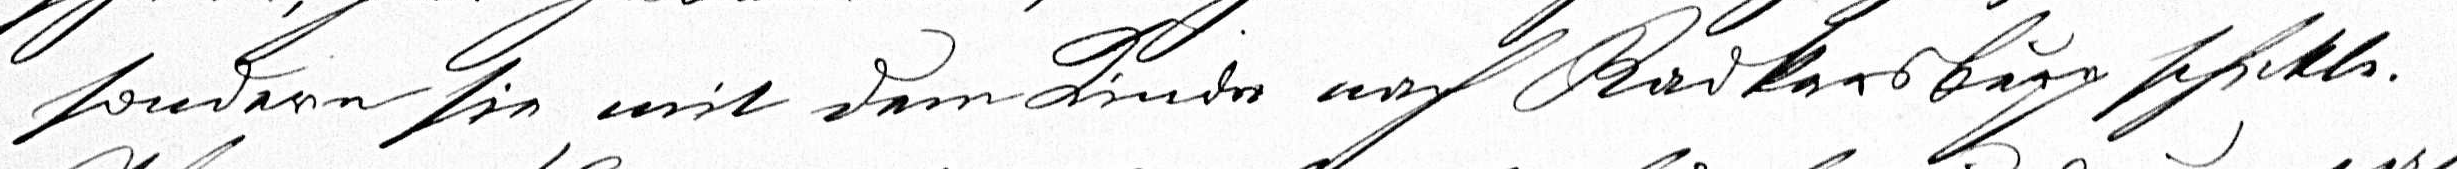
sondern sie mit dem Kinde nach Radkersburg schickte.
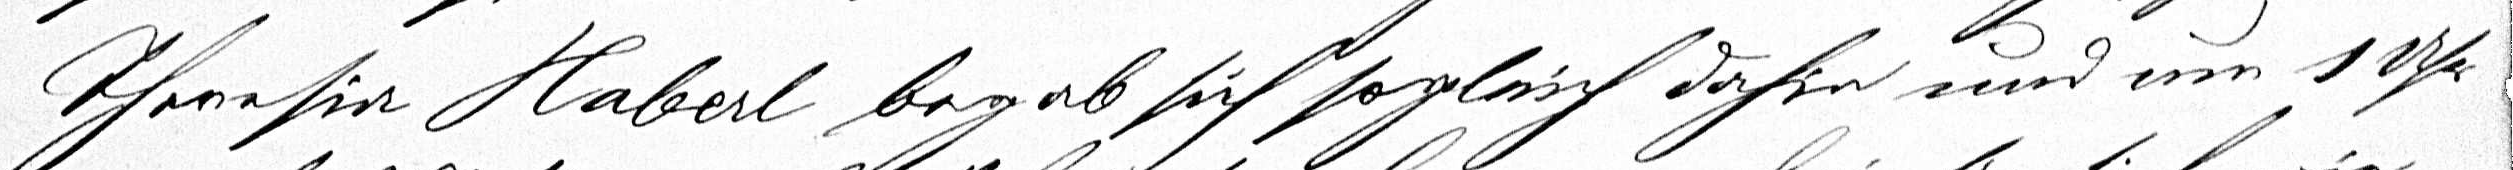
Theresia Haberl begab sich sogleich dahin und um 1Uhr
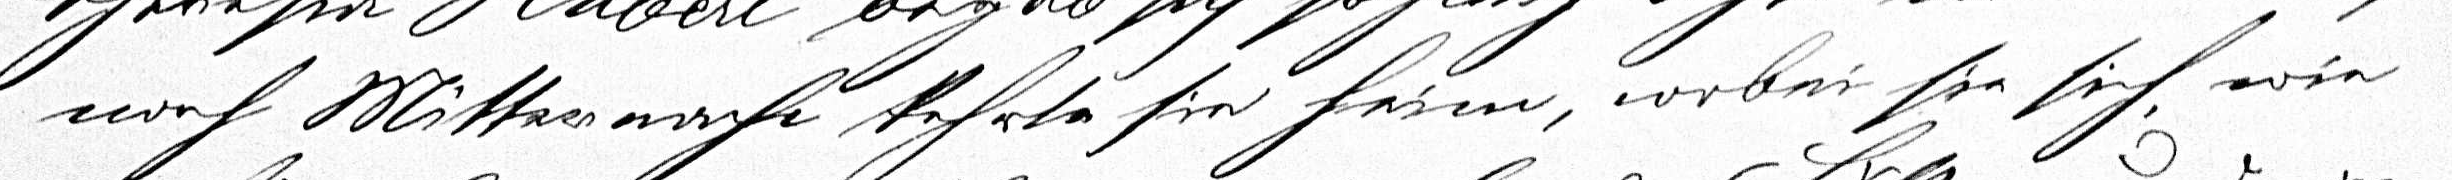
nach Mitternacht kehrte sie heim, wobei sie sich wie
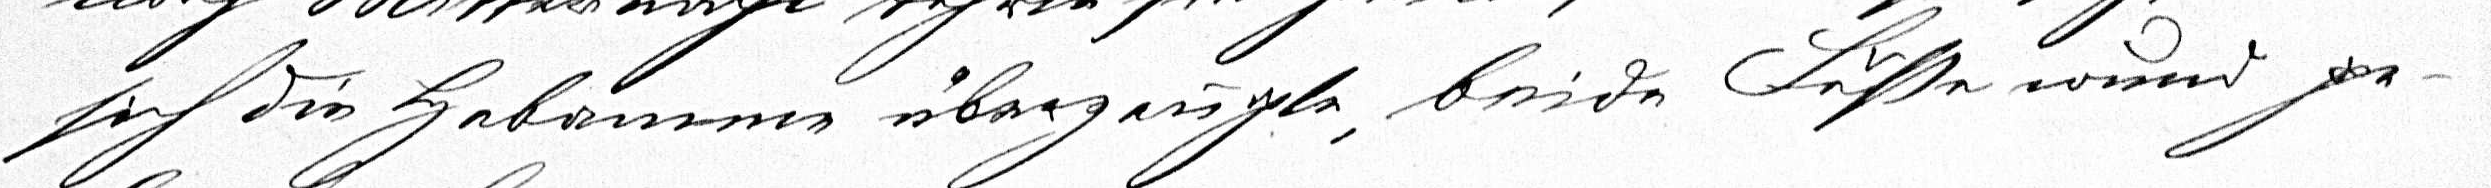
sich die Hebamme überzeugte, beide Füße wund ge¬
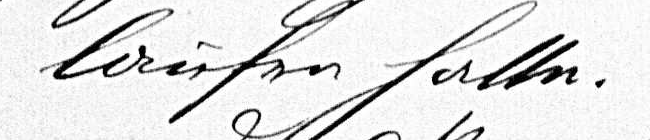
laufen hatte.
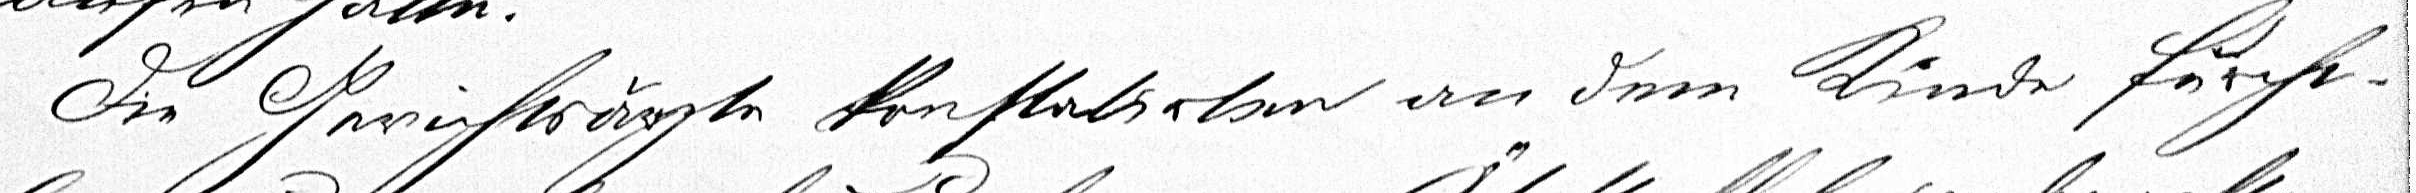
Die Gerichtsärzte konstatirten an dem Kinde fürcht¬
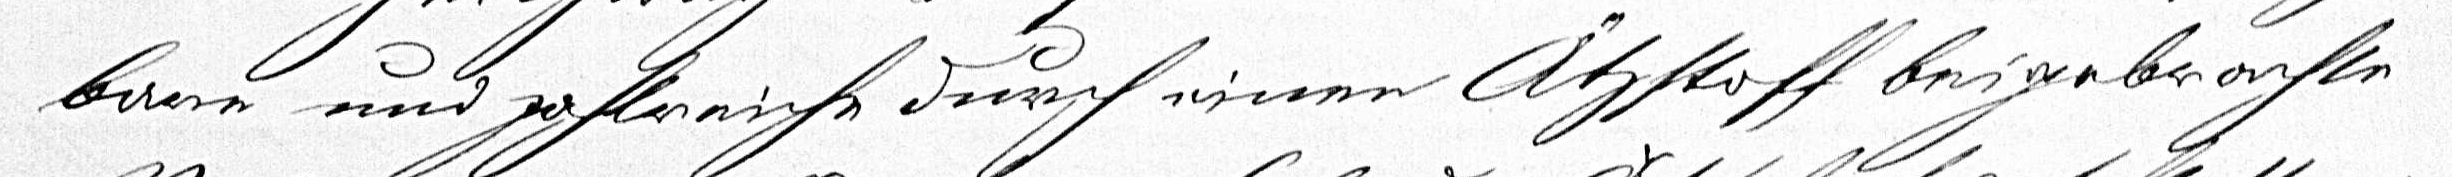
bare und zahlreiche durch einen Ätzstoff beigebrachte
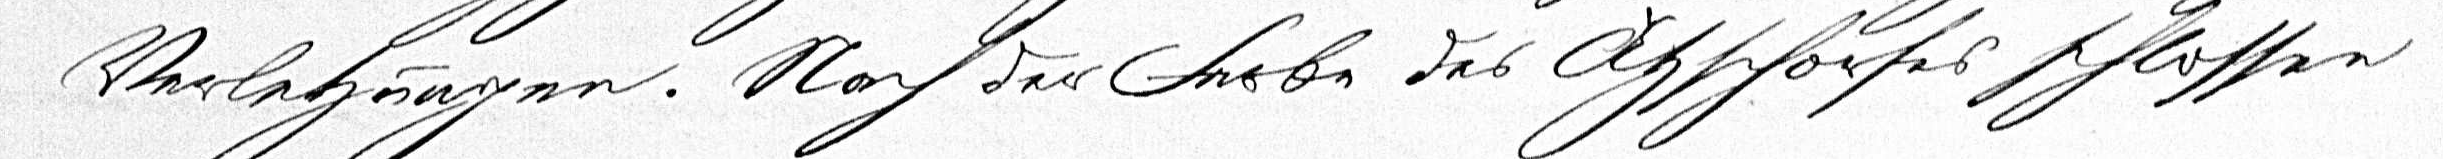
Verletzungen. Nach der Farbe des Ätzschorses schlossen
